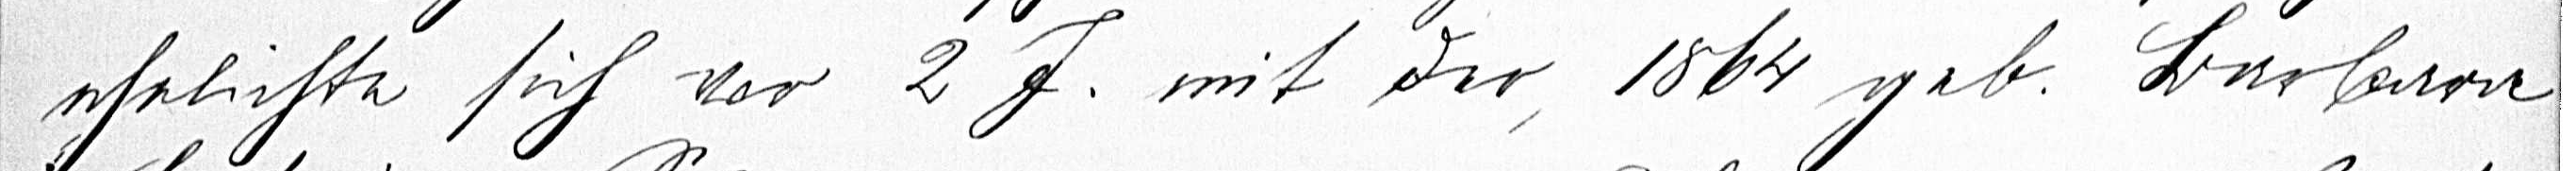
ehelichte sich vor 2 J. mit der, 1864 geb. Barbara
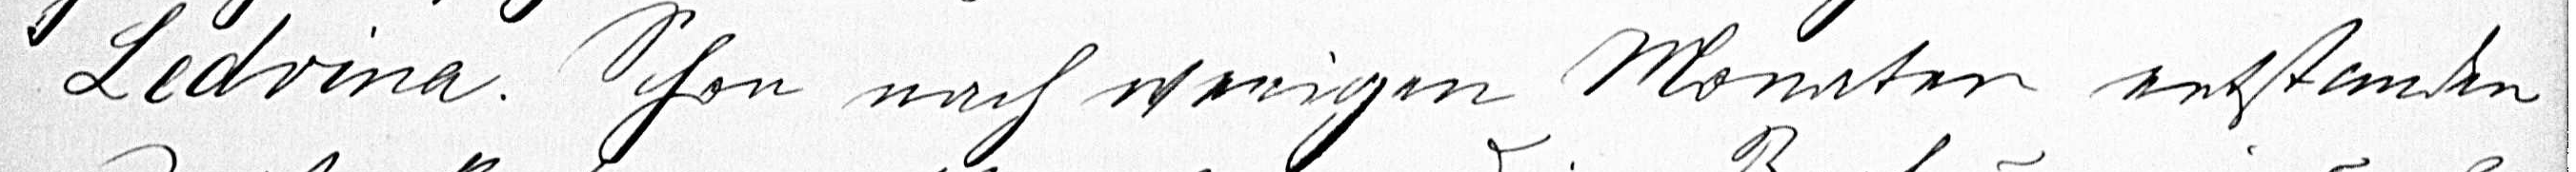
Ledvina. Schon nah wenigen Monaten entstanden
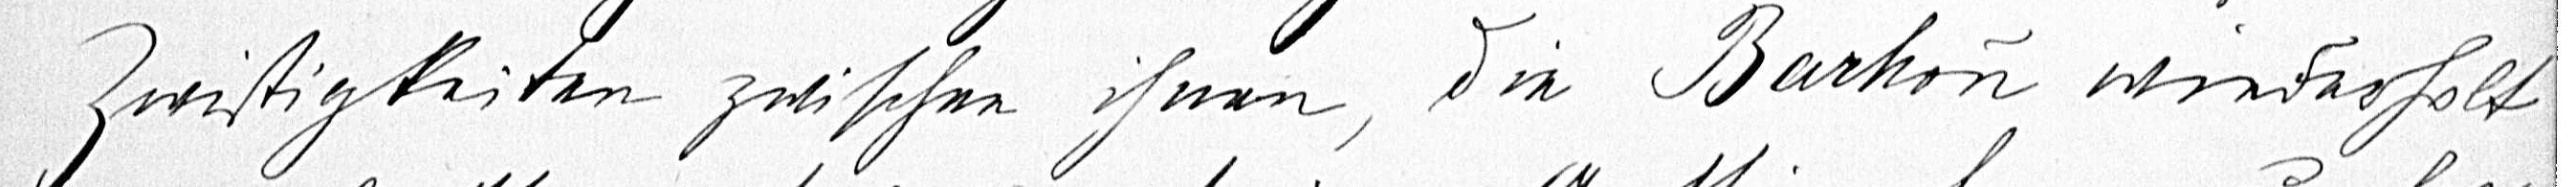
Zwistigkeiten zwischen ihnen, die Barhxx wiederholt
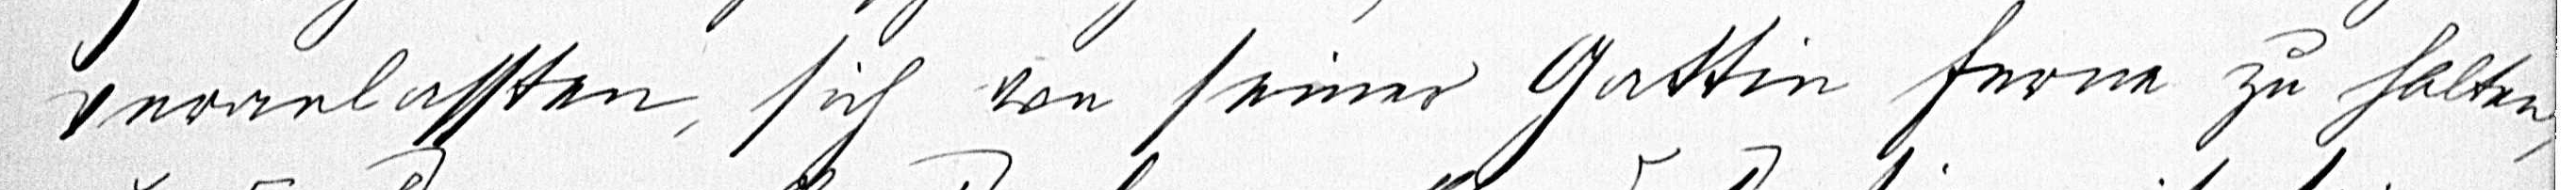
veranlassten, sich von seiner Gattin ferne zu halten,
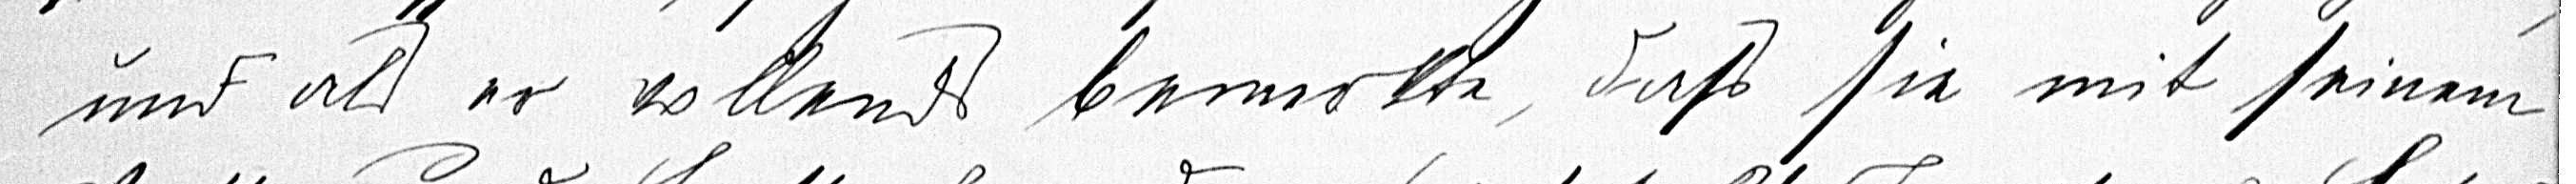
und als er vollends bemerkte, dass sie mit seinem
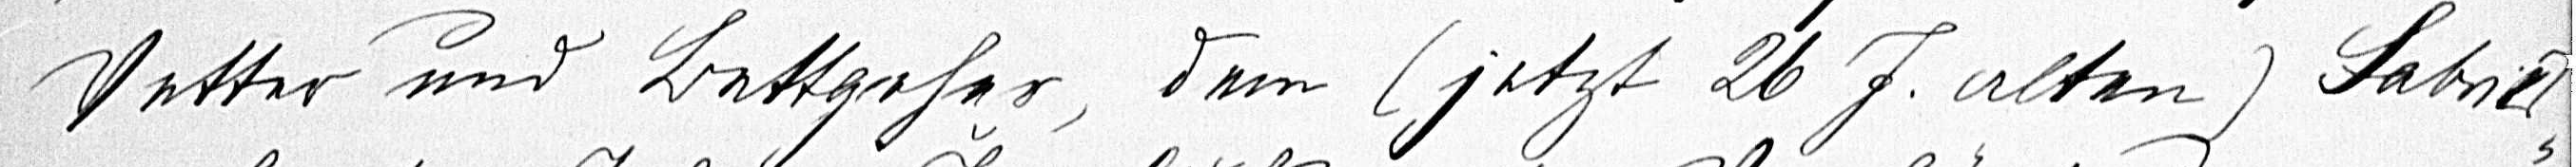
Vetter und Bettgeher, dem (jetzt 26 J. alten) Fabriks¬
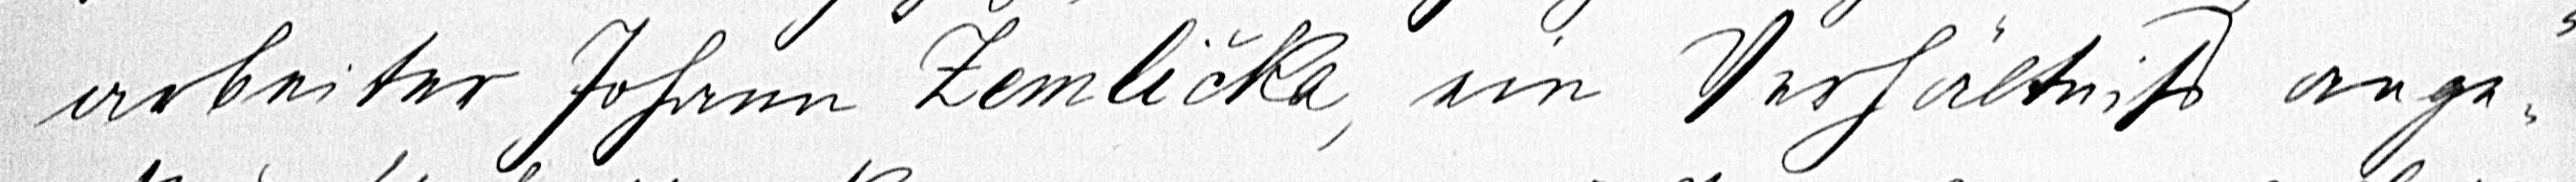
arbeiter Johann Žemlička, ein Verhältniss ange¬
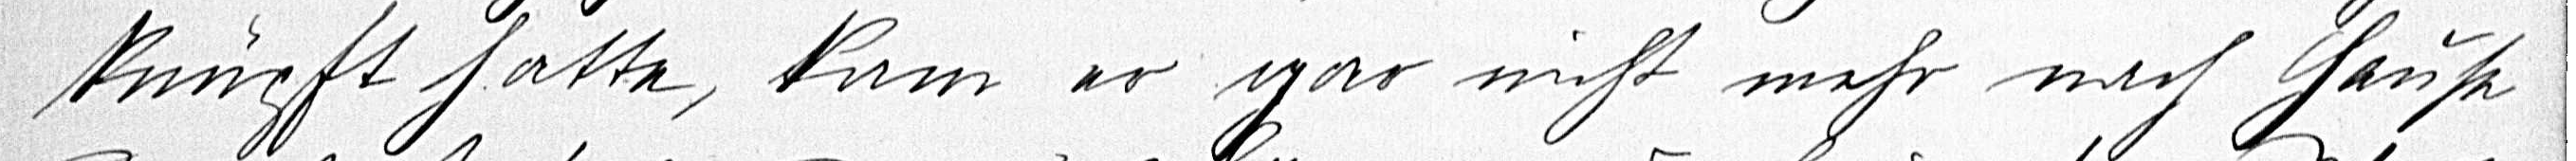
knüpft hatte, kam er gar nich mehr nach Huse
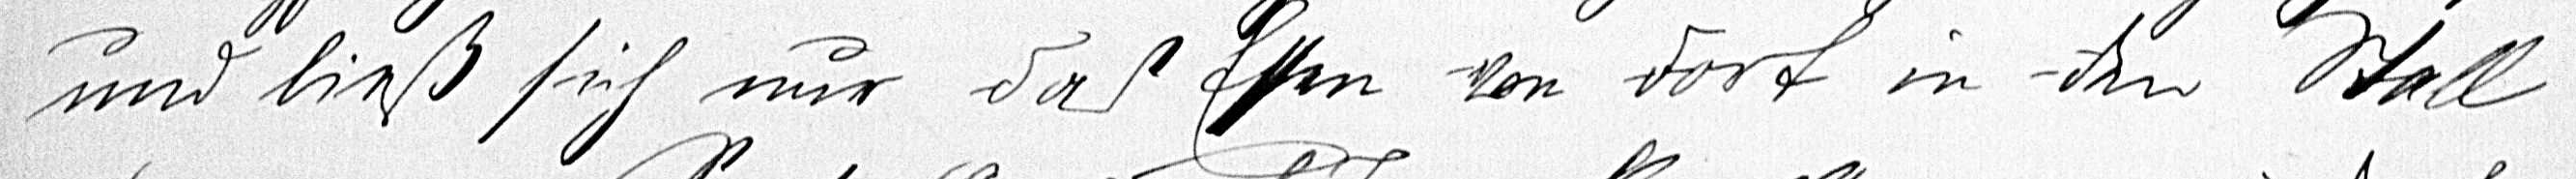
und ließ sich nur das Essen von dort in den Stall
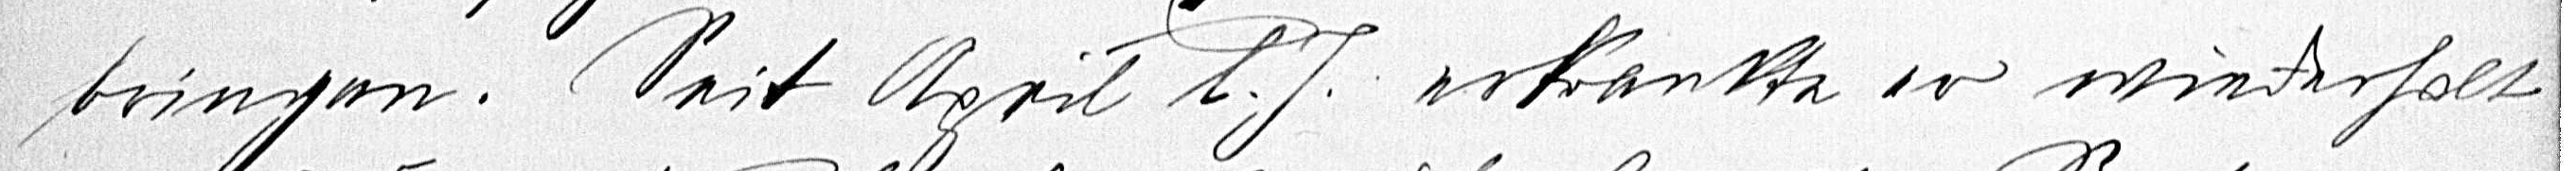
bringen. Seit April l. J. erkrankte er wiederholt
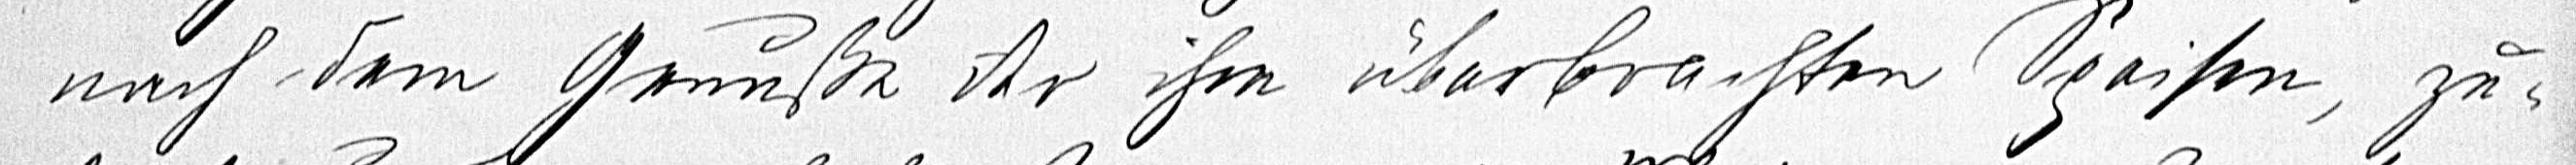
nach dem Genuße der ihm überbrachten Speisen, zu¬
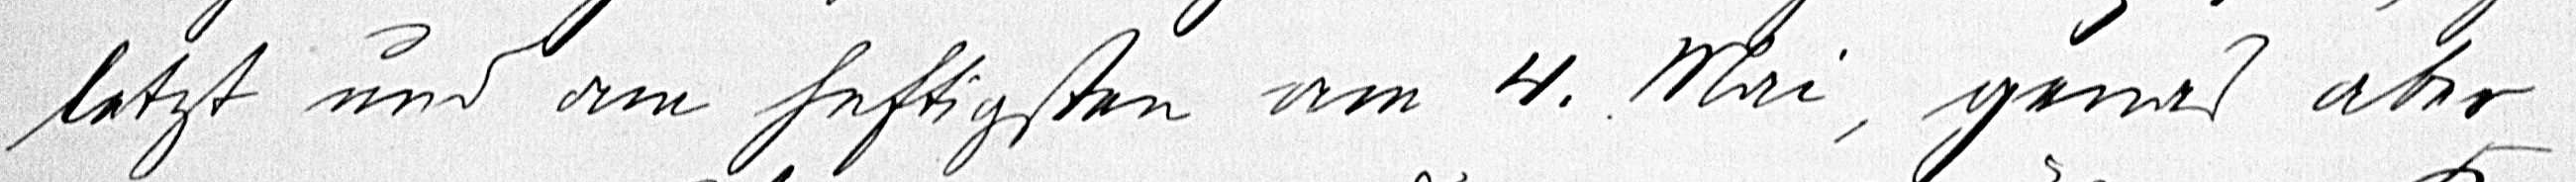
letzt und am heftigsten am 4. Mai, genas aber
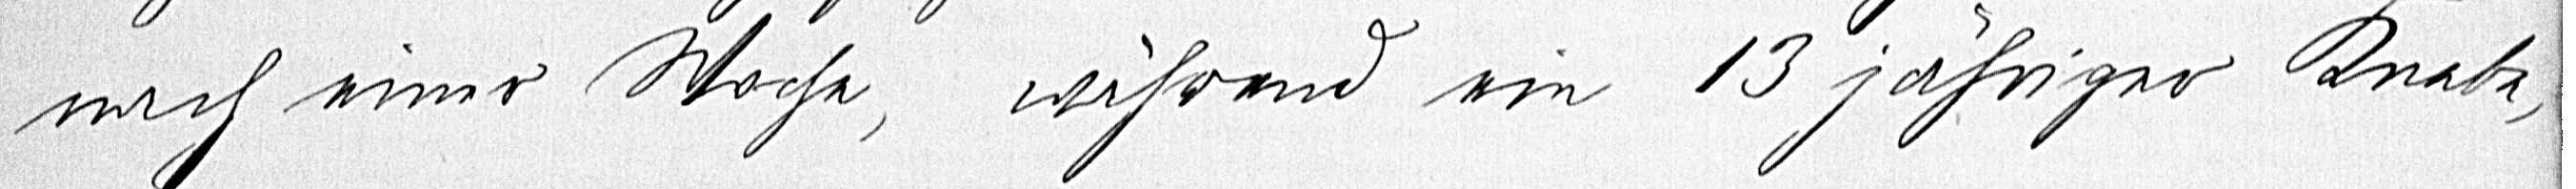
nach einer Woche, während ein 13 jähriger Knabe,
